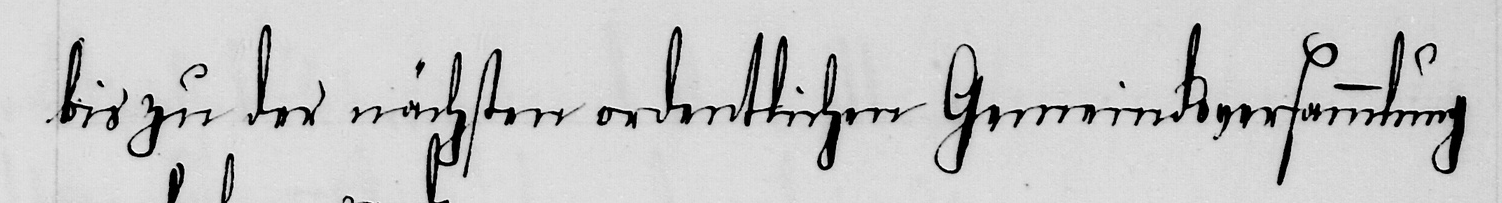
bis zu der nächsten ordentlichen Gemeindsversammlung
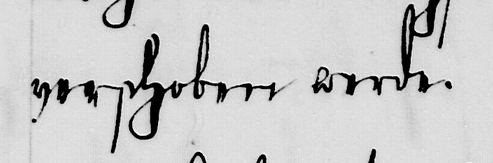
verschoben werde.
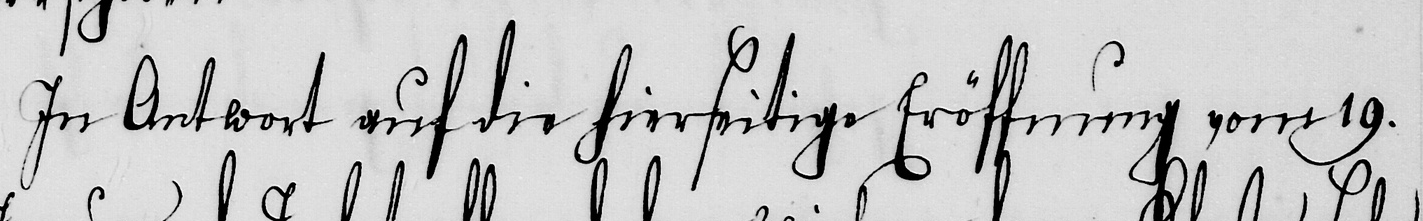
In Antwort auf die hierseitige Eröffnung vom 19.
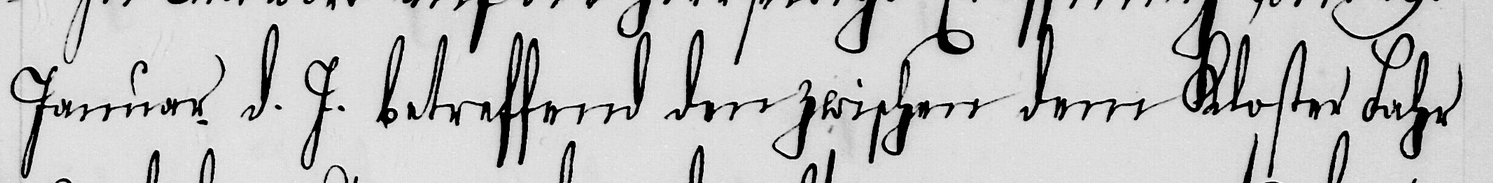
Januar d. J. betreffend den zwischen dem Kloster Fahr
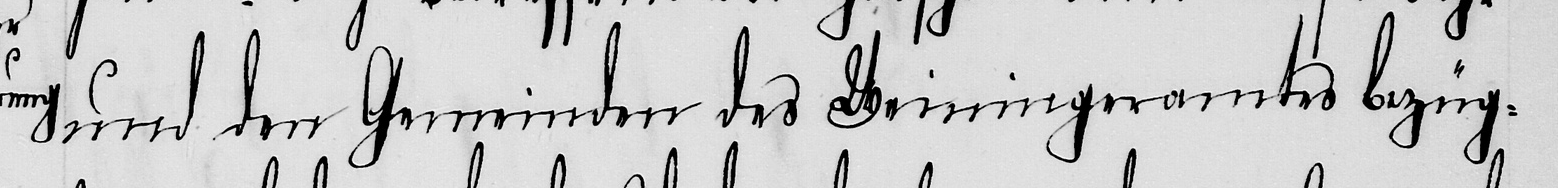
und den Gemeinden des Weiningeramtes bezüg¬
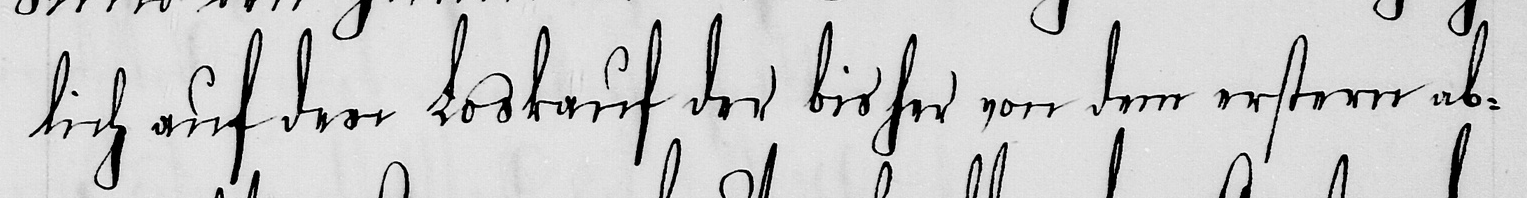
lich auf den Loskauf der bisher von dem erstern ob¬
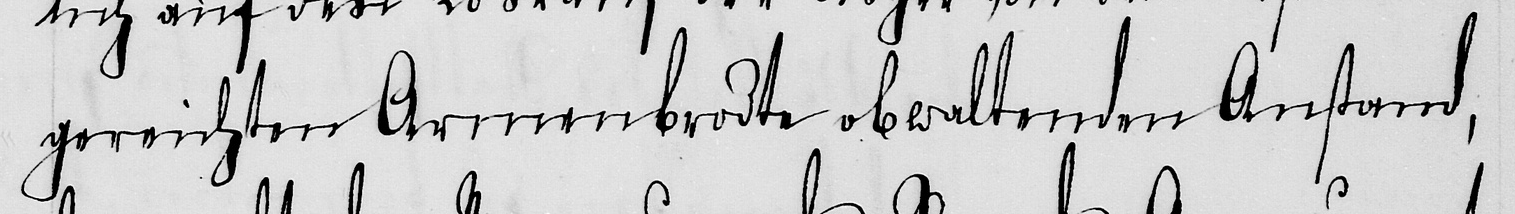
gereichten Armenbrodte obwaltenden Anstand,
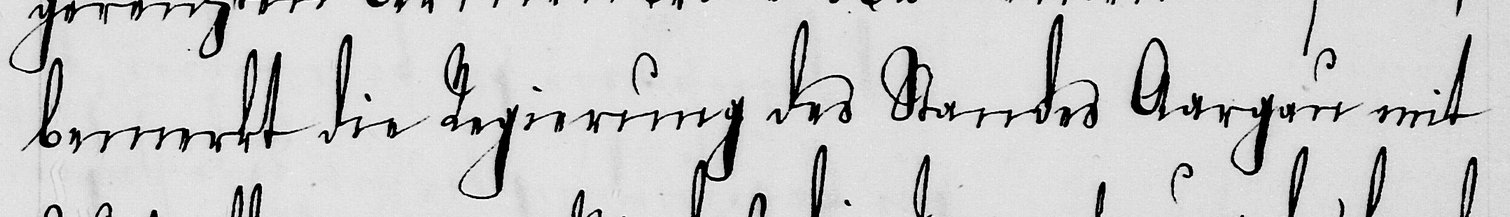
bemerkt die Regierung des Standes Aargau mit
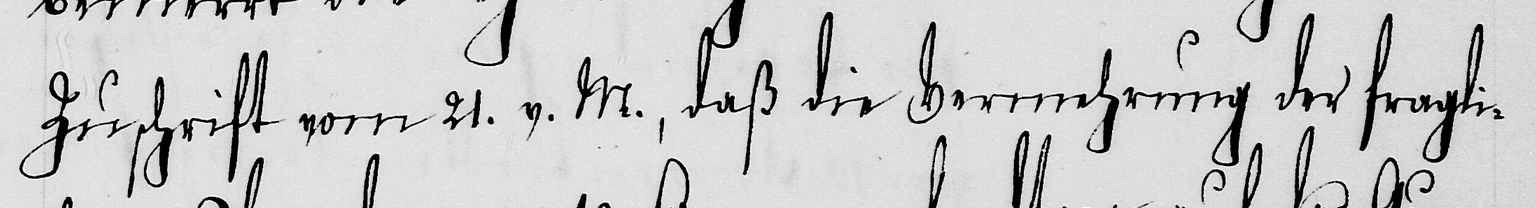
Zuschrift vom 21. v. M., daß die Vermehrung der fragli¬
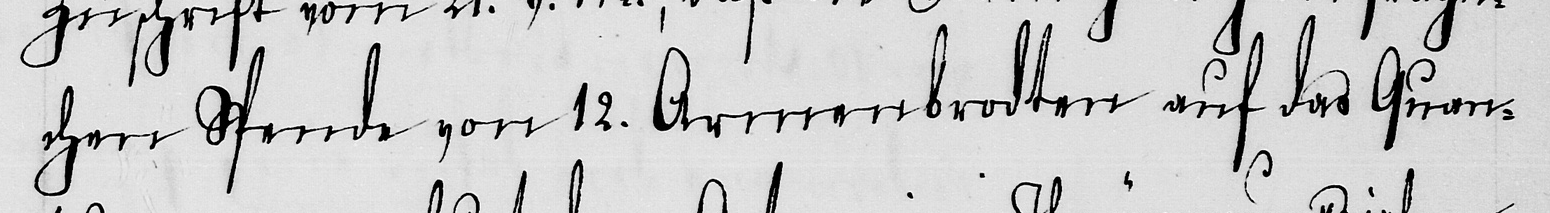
chen Spende von 12. Armenbrodten auf das Quan¬
